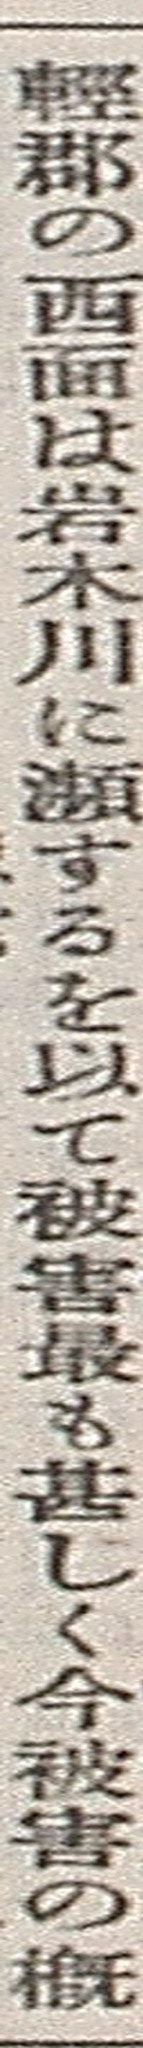軽郡の西面は岩木川に瀬するを以て被害最も甚しく今被害の概
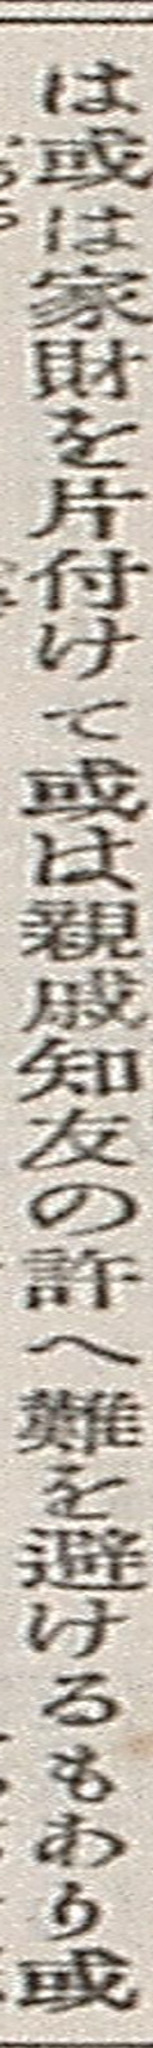は或は家財を片付けて或は親戚知友の許へ難を避けるもあり威
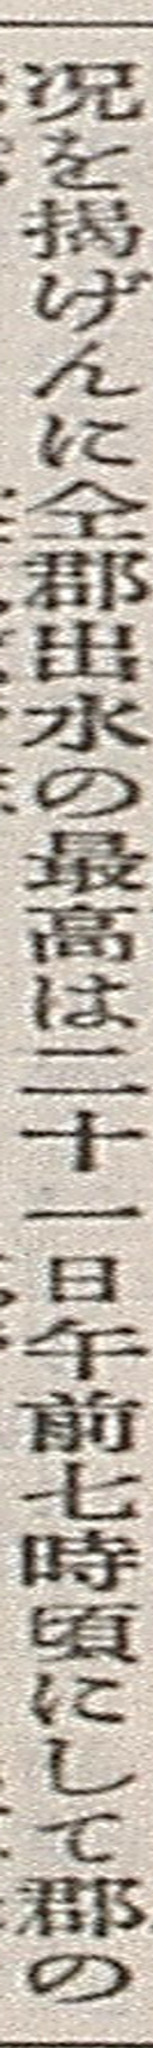況を揚げんに同郡出水の最高は二十一日午前七時頃にして郡の
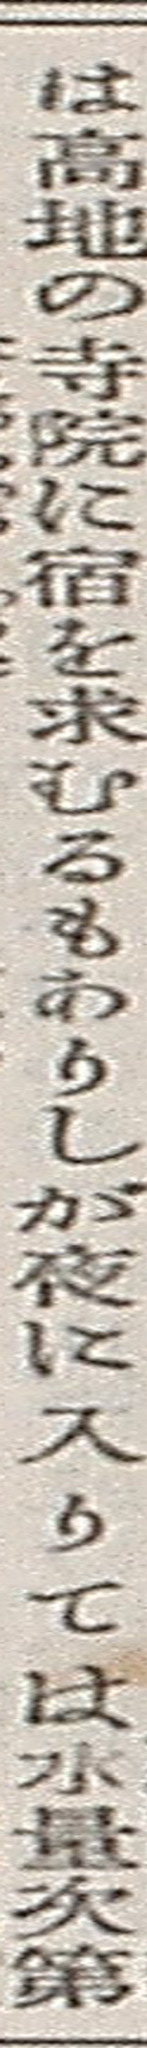は高地の寺院に宿を求むるもありしが夜に入りては水量次第
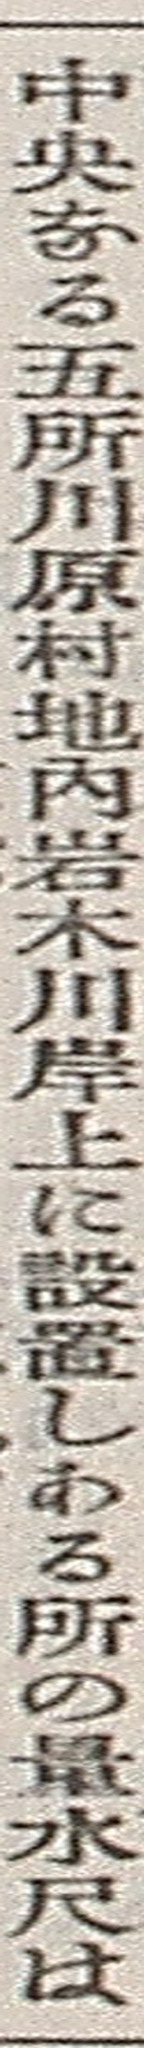中央なる五所川原村地内岩木川岸上に設置しある所の量水尺は
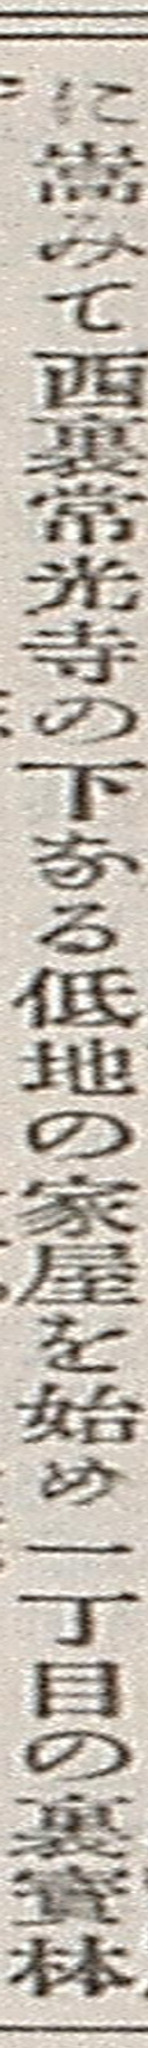に嵩みて西裏常光寺の下なる低地の家屋を始め一丁目の裏寶林
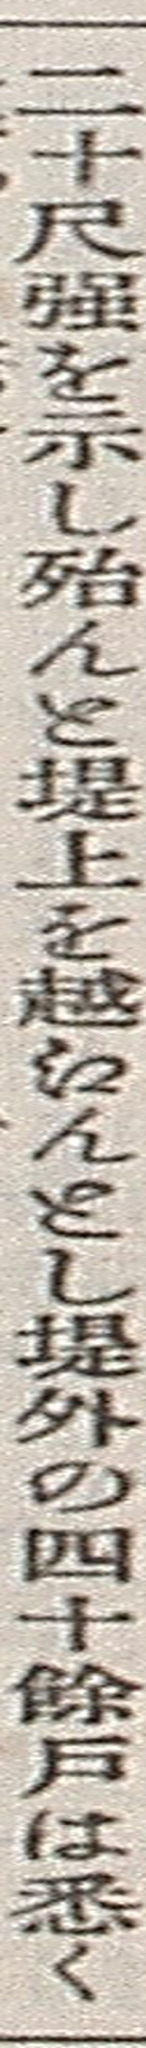二十尺強を示し殆んど堤上を越えんとし堤外の四十餘戸は悉く
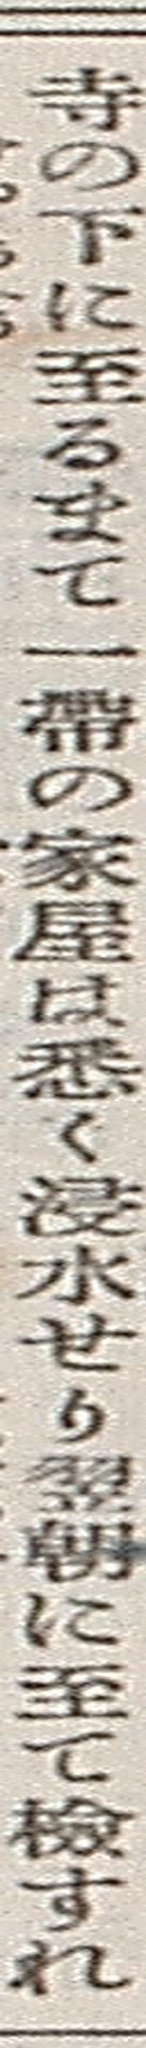寺の下に至るまで一帯の家屋は悉く浸水せり翌朝に至て検すれ
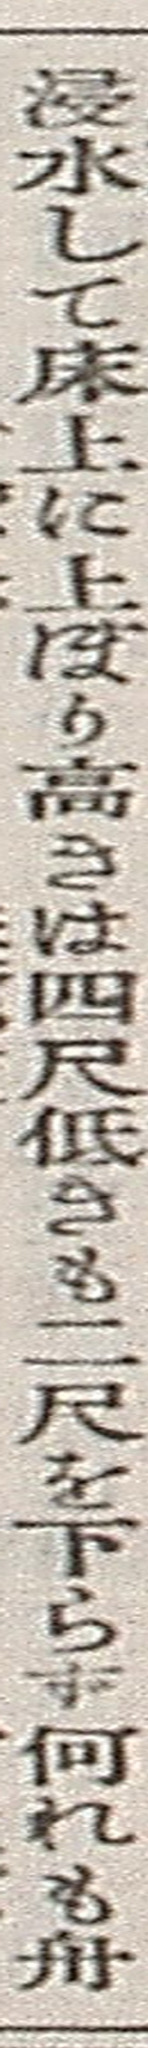浸水して床上に上ぼり高きは四尺低きも二尺を下らず何れも舟
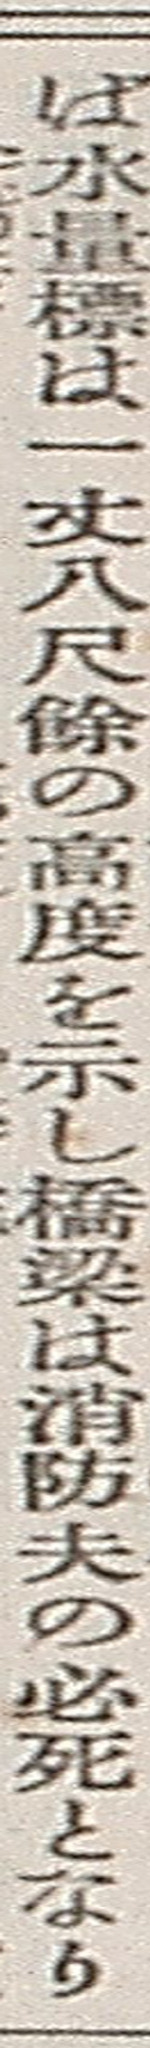ば水量標は一丈八尺餘の高度を示し橋梁は消防夫の必死となり
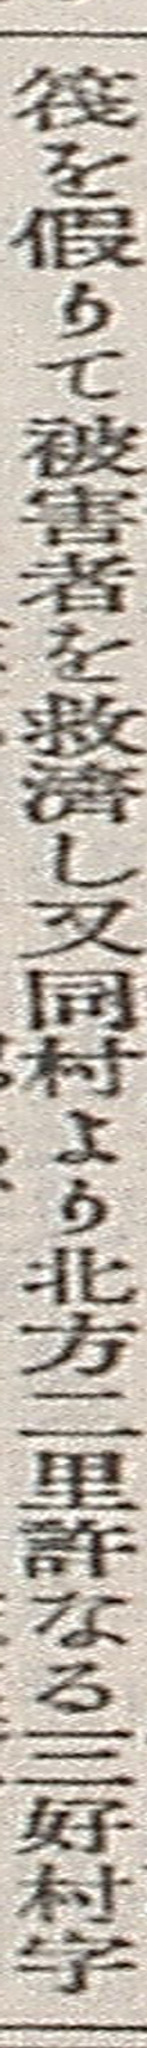筏を仮りて被害者を救済し又同村より北方二里許なる三好村字
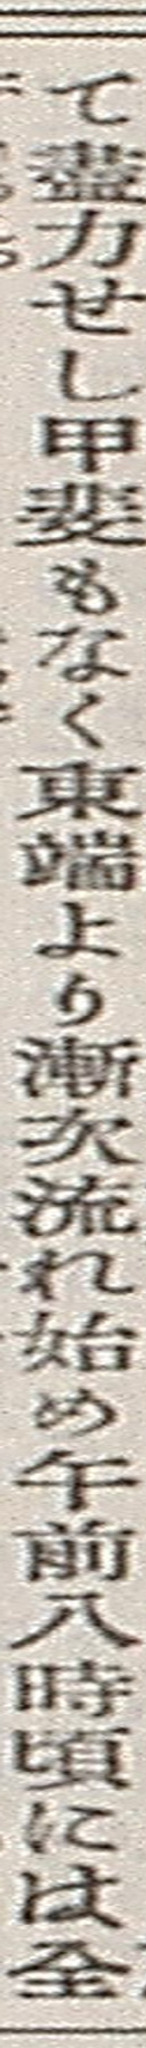て尽力せし甲斐もなく東端より漸次流れ始め午前八時頃には全
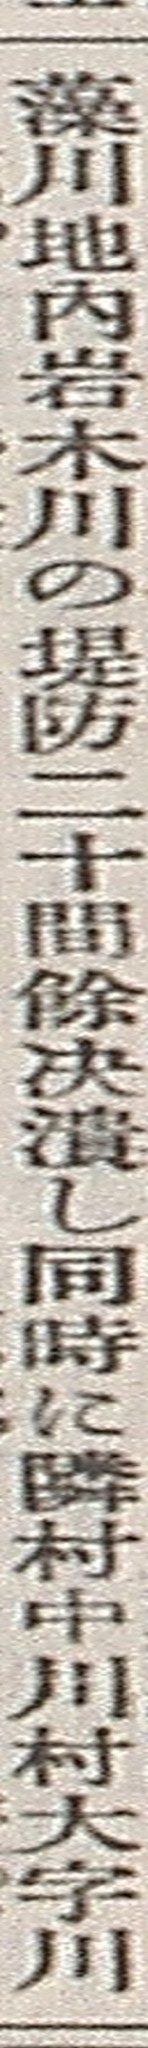藻川知内岩木川の堤防二十間餘决潰し同時に隣村中川村大字川
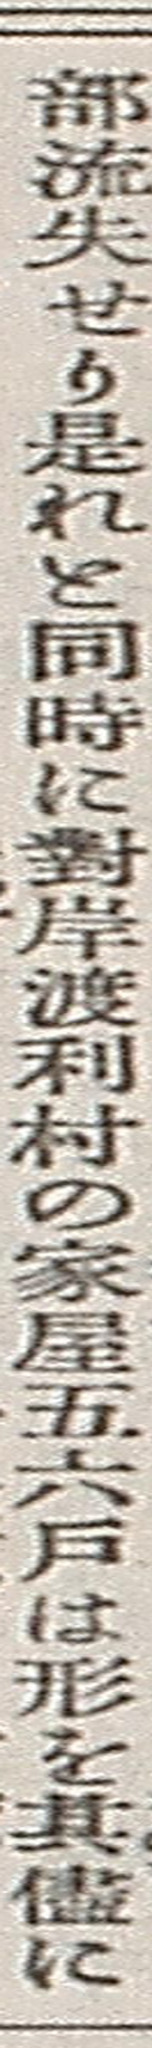部流失せり是れと同時に対岸渡利村の家屋五六戸は形を其儘に
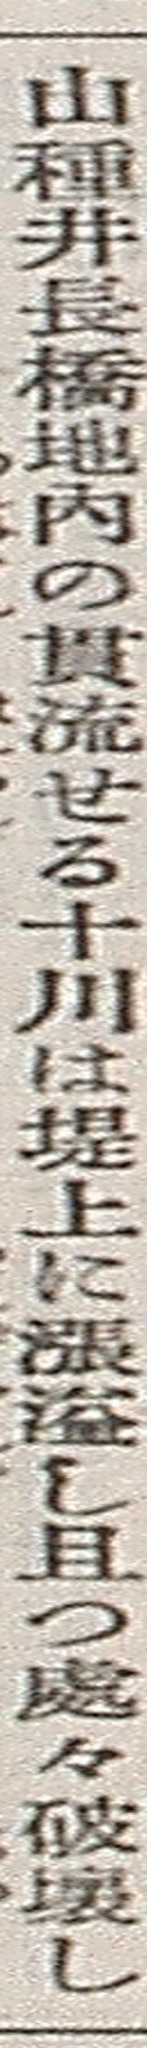山種井長橋地内の貫流せる十川は堤上に漲溢し且つ処々破壊し
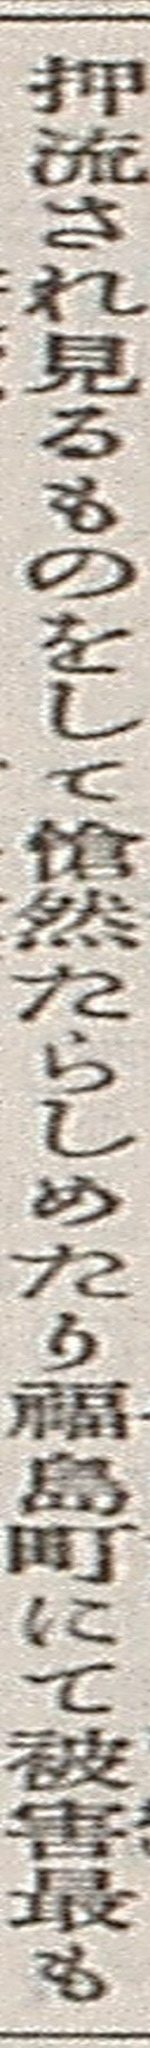押流され見るものをして愴然たらしめたり福島町にて被害最も
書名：風俗畫報臨時増刊第百二十八號　洪水被害録（下）
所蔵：東京大学地震研究所図書室 Earthquake Research Institute Library, The University of Tokyo, JAPAN
